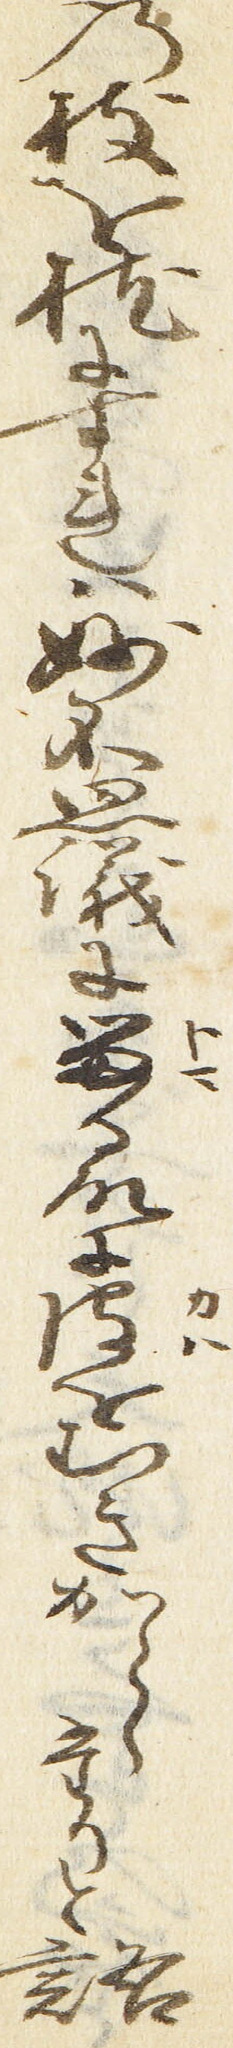の枝を枕にすれは妙不思議に留る故に皮をむきからしたりと語
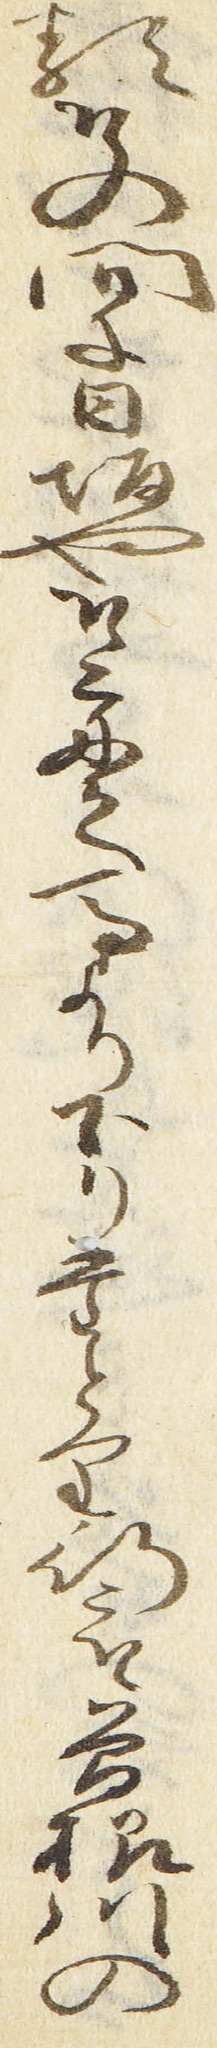るその間に日坂也そこにて馬より下りたとり行こそ曽根川の

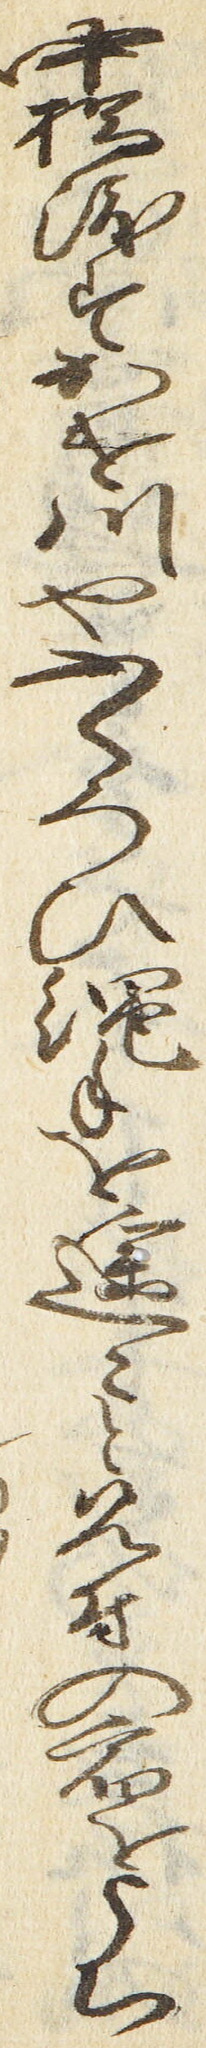中橋渡すかけ川やふくろひ縄手を遥々と見付の宿をうち
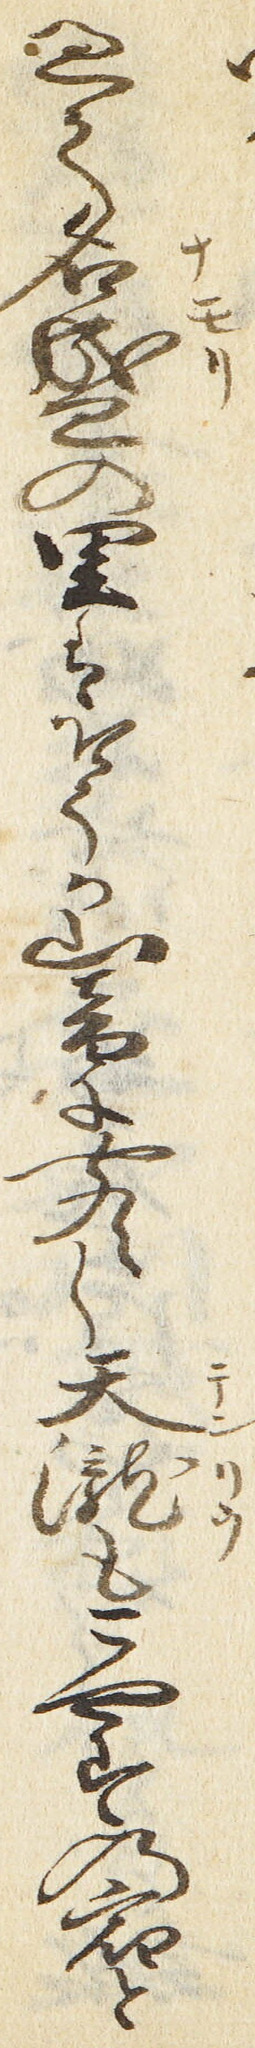過て名盛の里はそうか山音に聞えし天龍もこやすの宿と
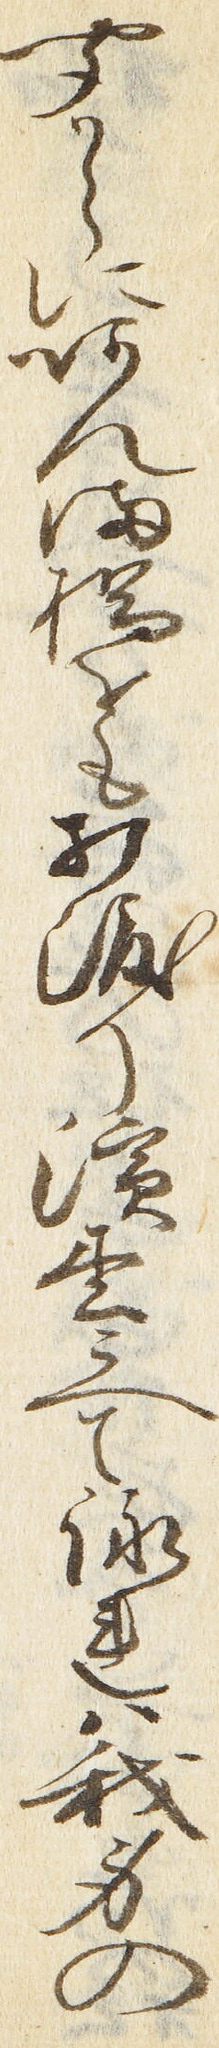聞からにあんま橋をも打渡り浜松こへて詠れは我身の
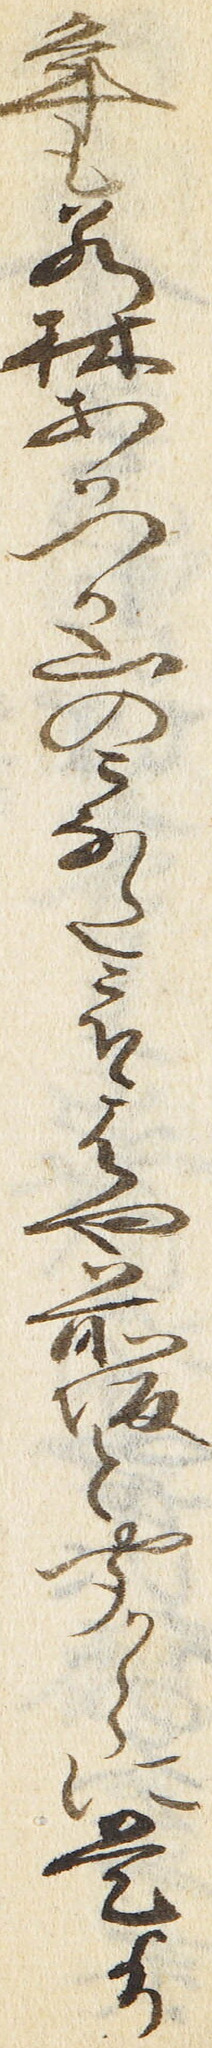年も若林あかつか山のこなたこそはや前坂と聞からに是より
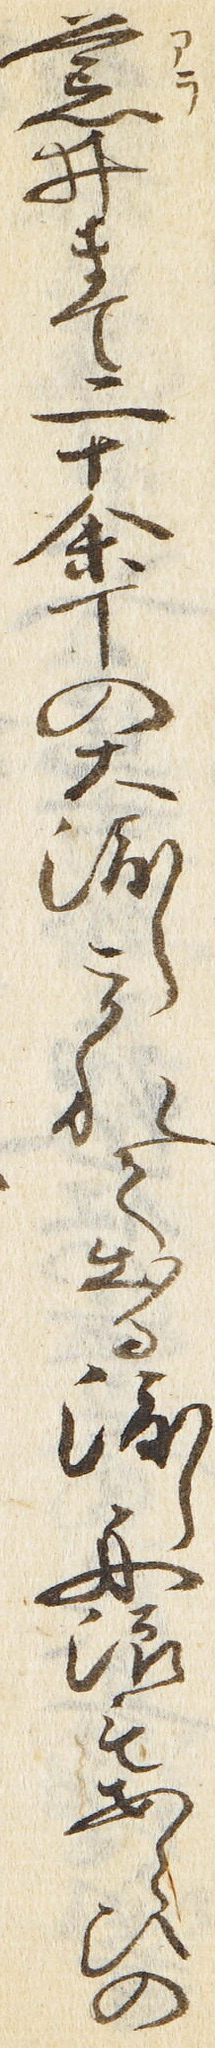荒井まて二十余丁の大渡しこかれて出る渡し舟浪もあらひの
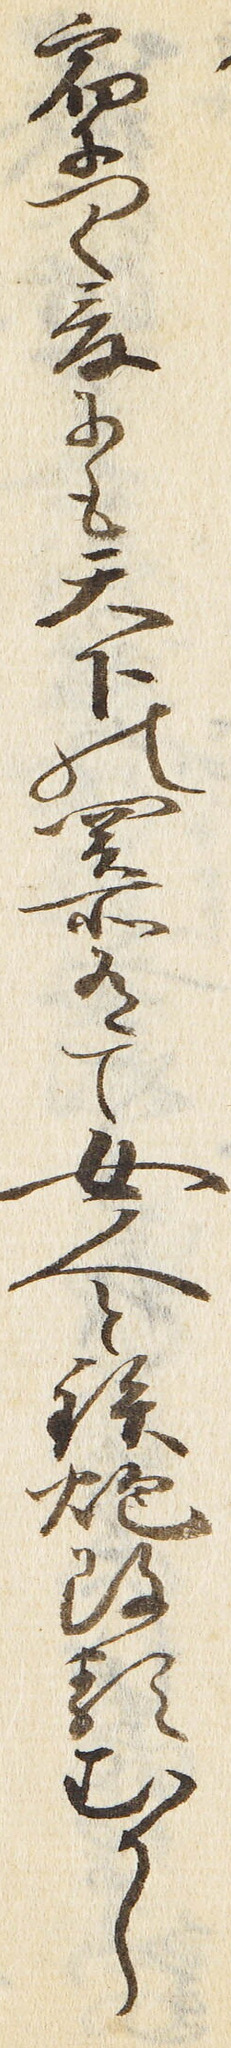宿につく爰にも天下の買所有て女人と鉄炮改るむかし
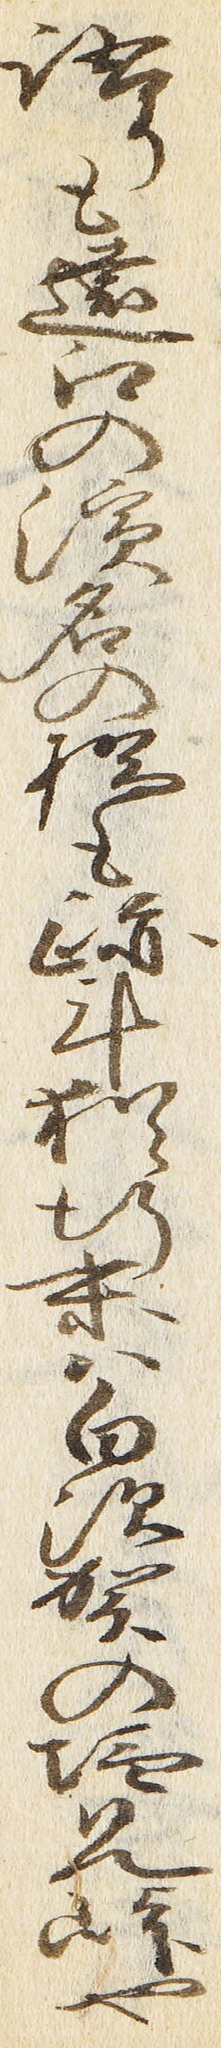語りも遠江の浜名の橋も跡計猶行末は白須賀の塩見峠や
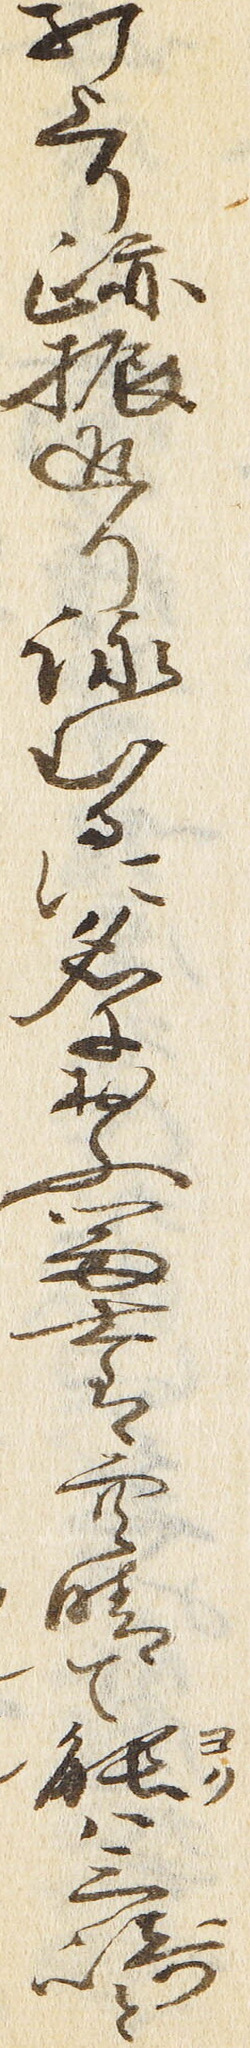打上り跡振返り詠むるに名におふ富士は空晴て能は三崎と
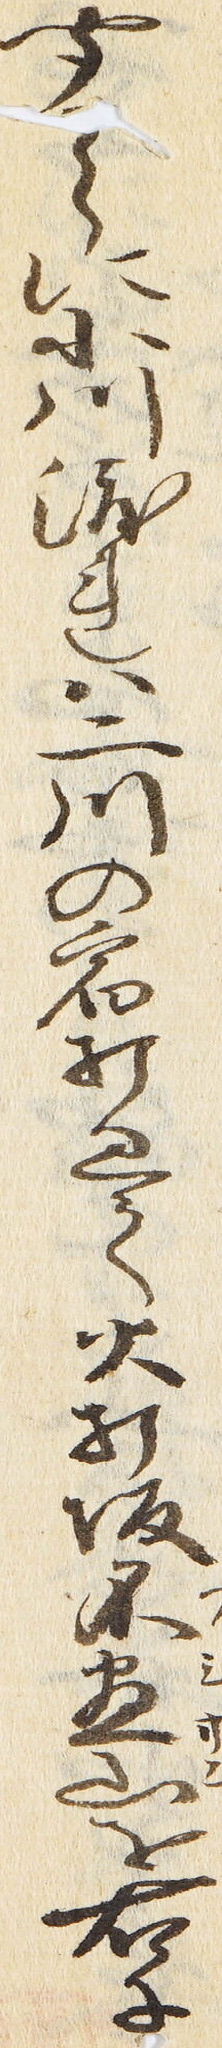聞からに小川渡れは二川の宿打過て火打坂不尽山を右に
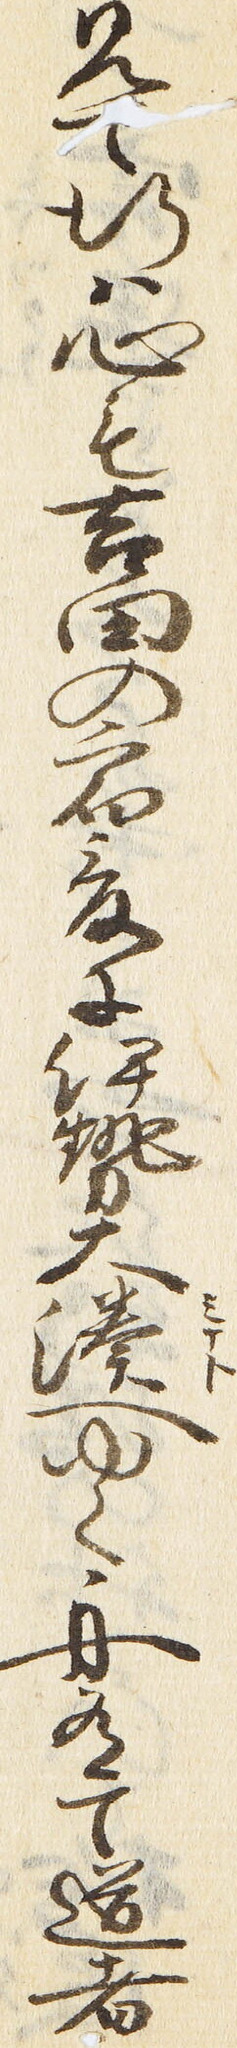見て行は心も吉田の宿爰に伊勢大湊へゆく舟有て道者
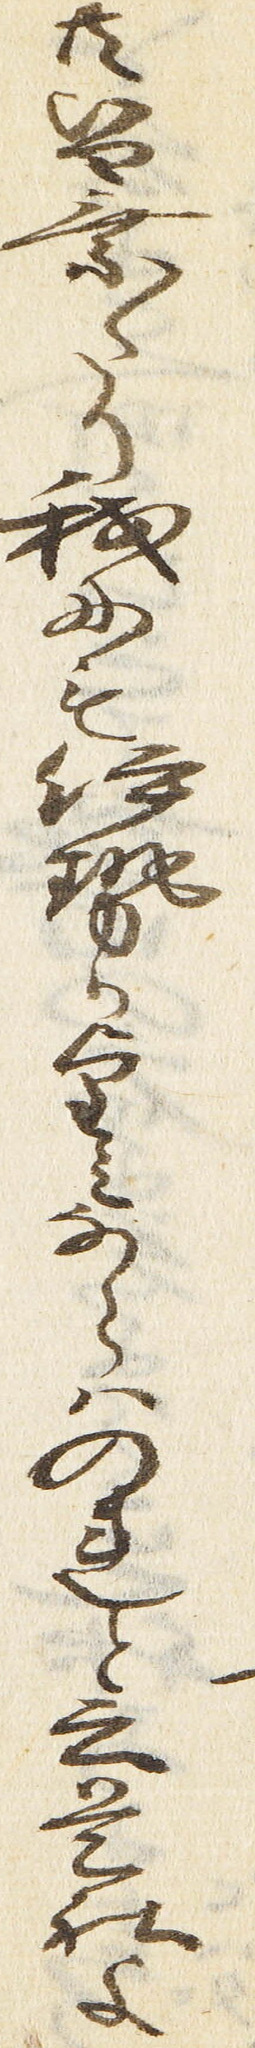共皆乗たり我にも伊勢か望みならはのれと云是社よ
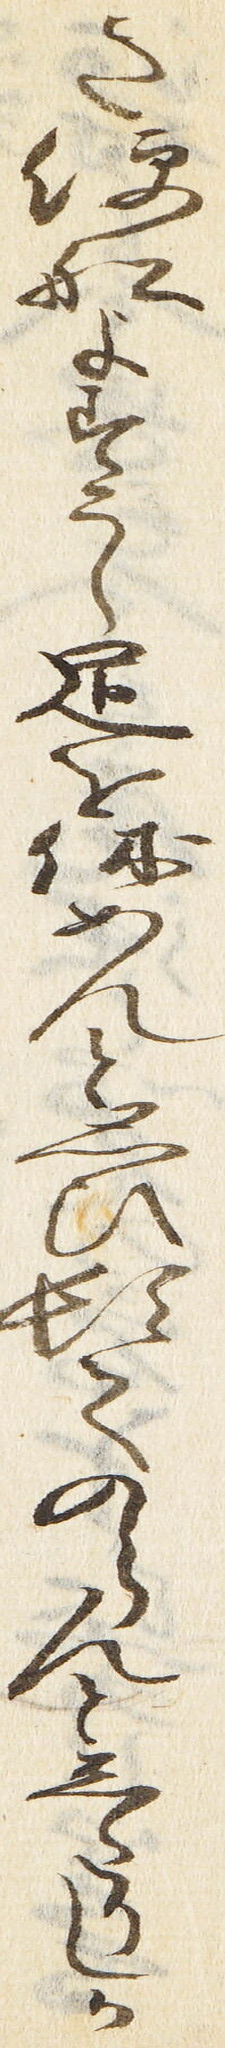き便船よすこし足を休めんと思ひ頓てのらんとしたりしか
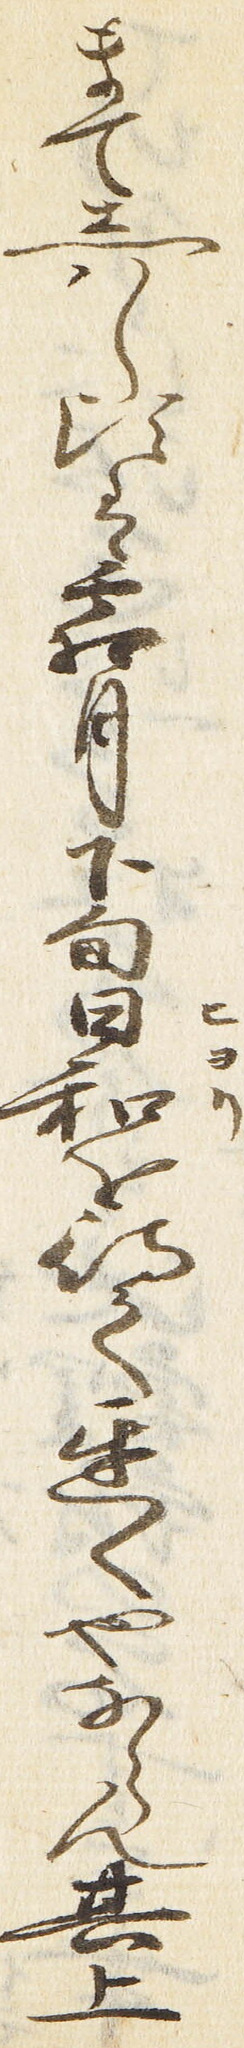まてしはし頃は霜月下旬日和を待て遅くやならん其上
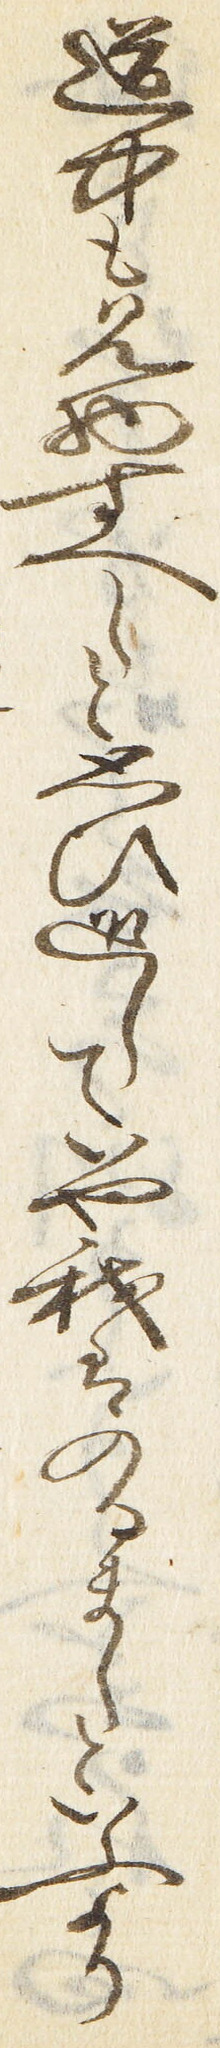道中も見物すへしと思ひ返していや我はのるましといふより
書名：海陸世話日記
